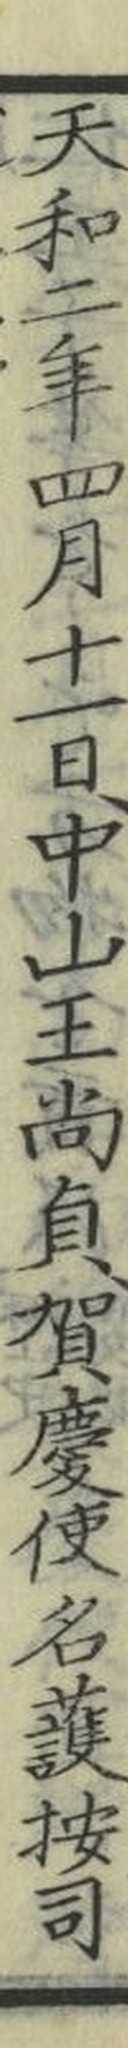天和二年四月十一日、中山王尚貞、賀慶使名護按司
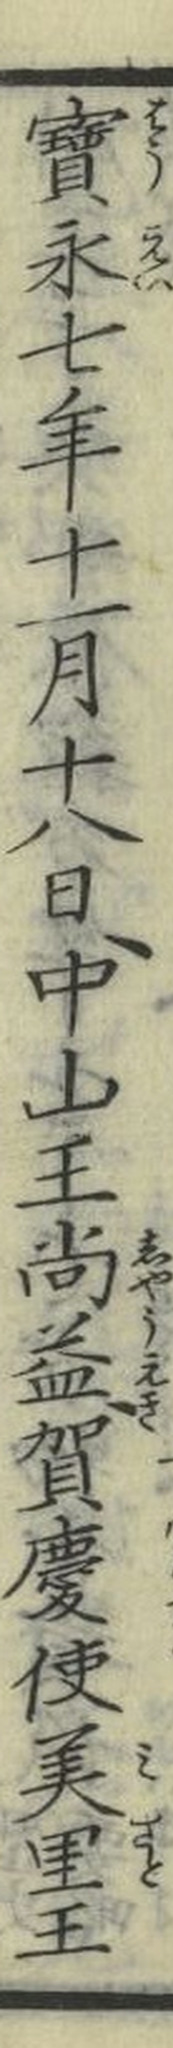宝永七年十一月十八日、中山王尚益、賀慶使美里王
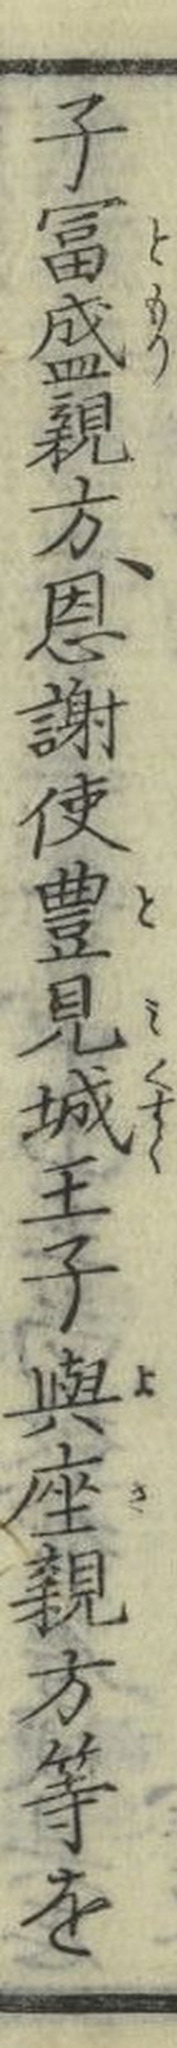子富盛親方、恩謝使豊見城王子与座親方等を
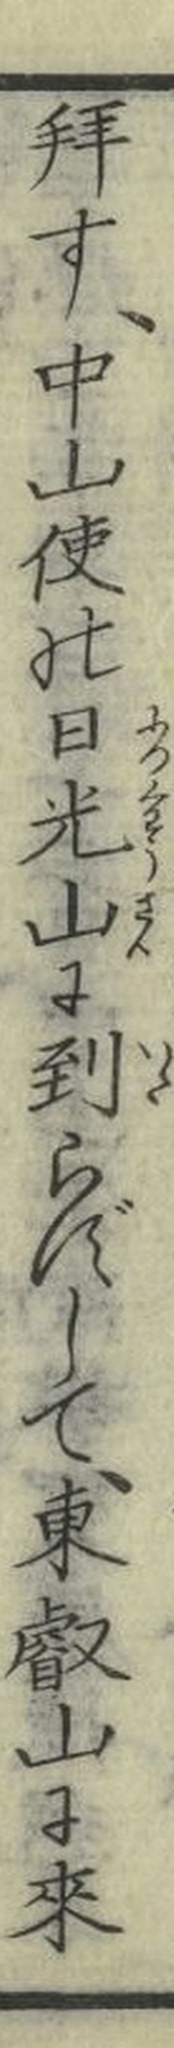拝す、中山使の日光山に到らずして、東叡山に来
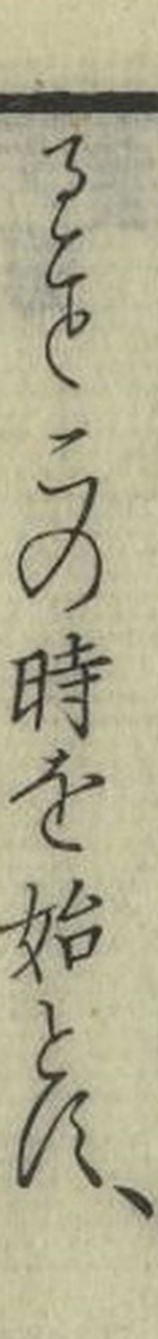ることこの時を始とす、
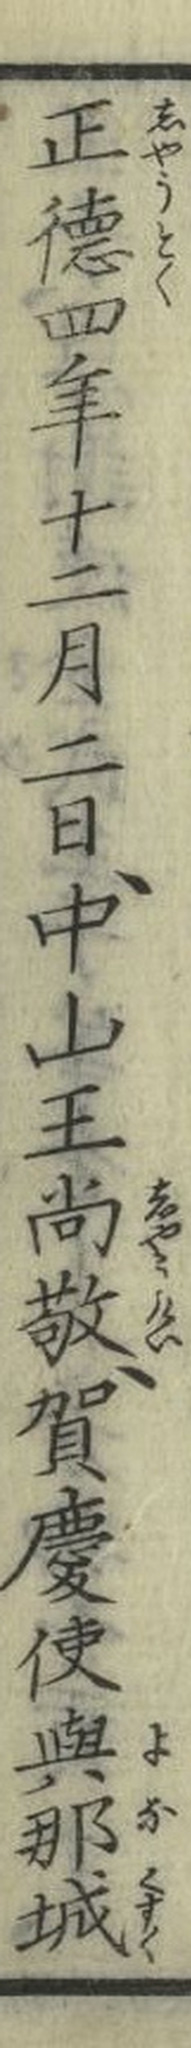正徳四年十二月二日、中山王尚敬、賀慶使与那城

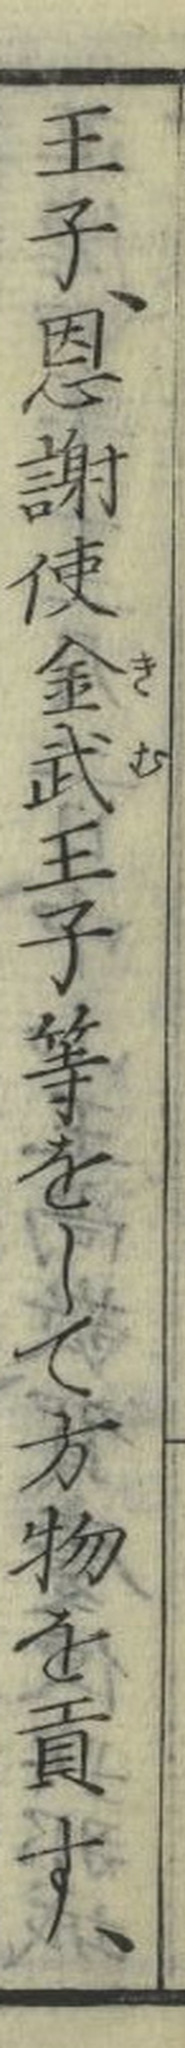王子、恩謝使金武王子等をして方物を貢す、
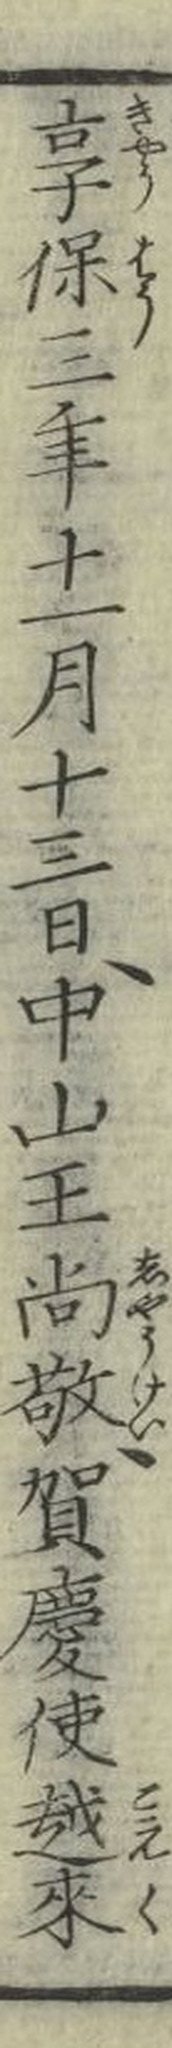享保三年十一月十三日、中山王尚敬、賀慶使越来
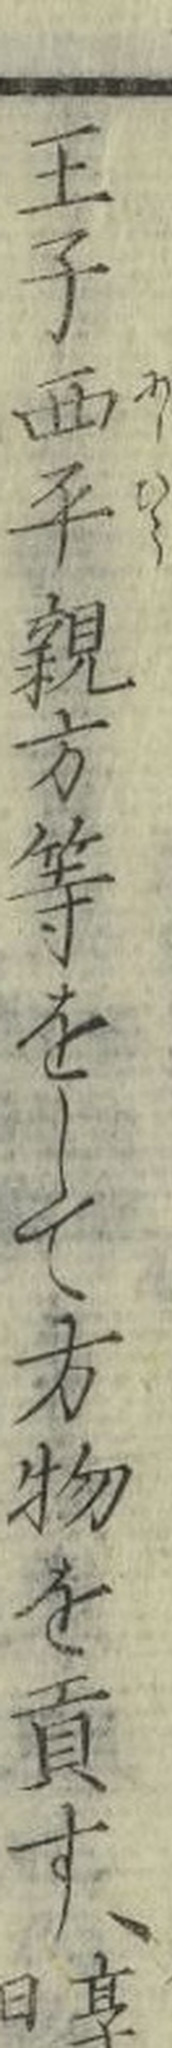山王子小禄親方等をして方物を貢す、
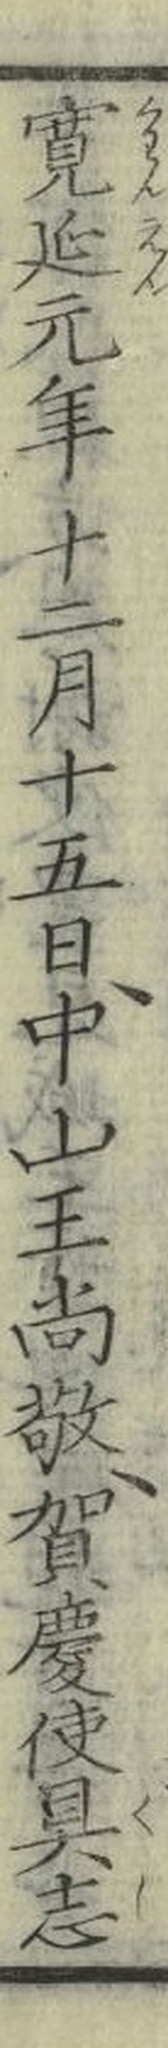寛延元年十二月十五日、中山王尚敬、賀慶使具志
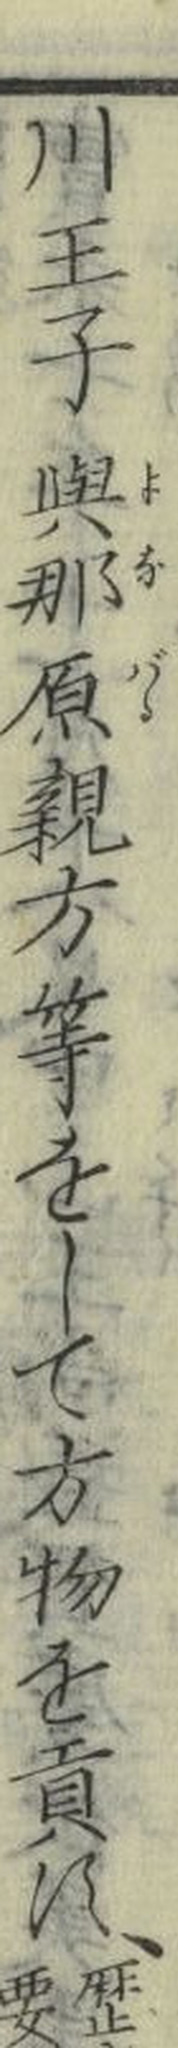山王子小禄親方等をして方物を貢す、
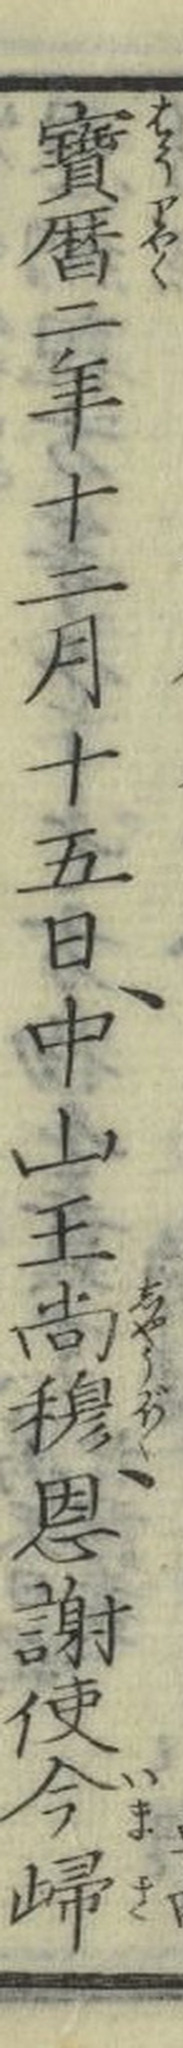宝暦二年十二月十五日、中山王尚穆、恩謝使今帰
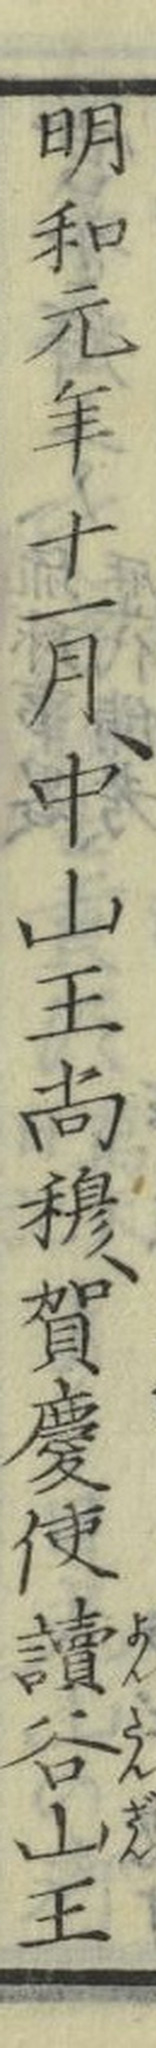明和元年十一月、中山王尚穆、賀慶使読谷山王
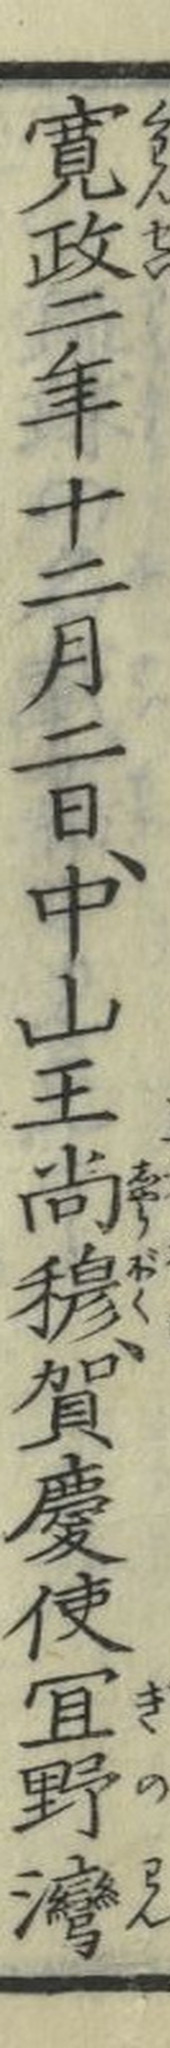寛政二年十二月二日、中山王尚穆、賀慶使宜野湾
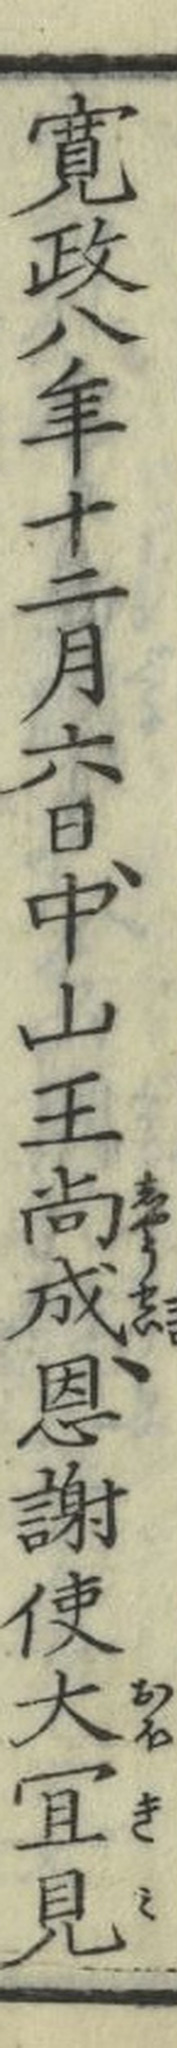寛政八年十二月六日、中山王尚成、恩謝使大宜見
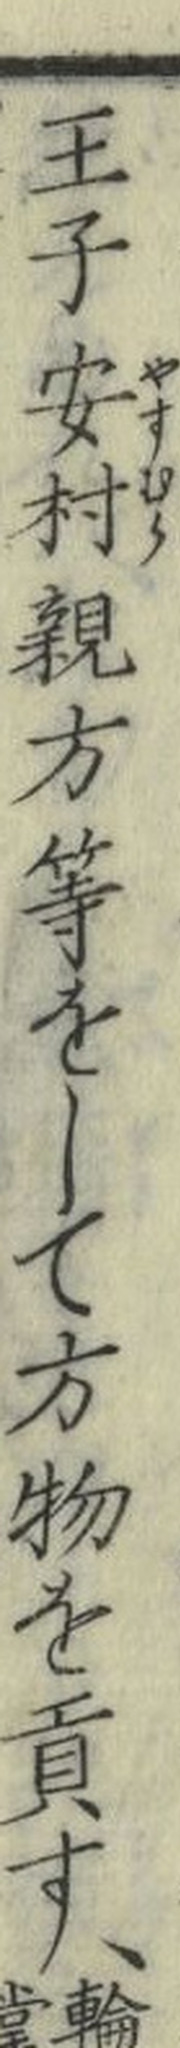山王子小禄親方等をして方物を貢す、
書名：琉球入貢紀畧
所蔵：University of the Ryukyus Library
